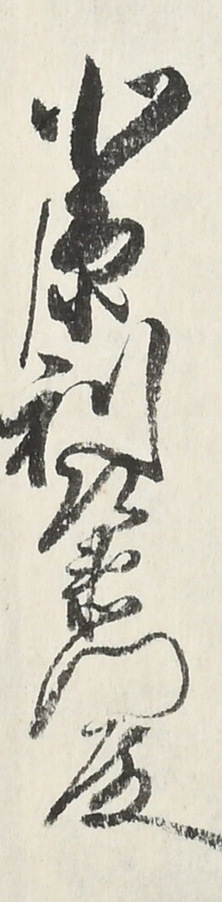北原利左衛門殿
